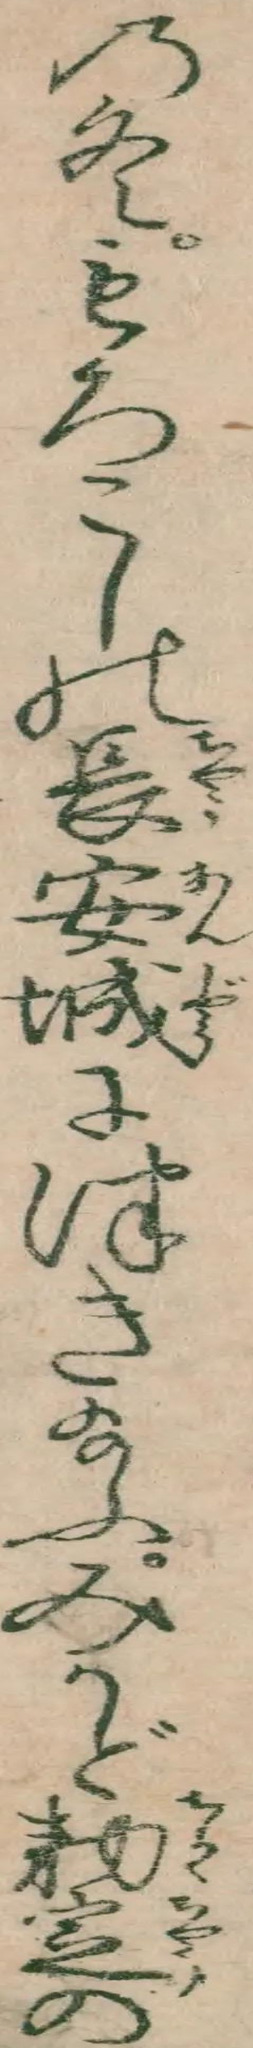の冬。もろこしの長安城につき給ふ。みかど勅定の
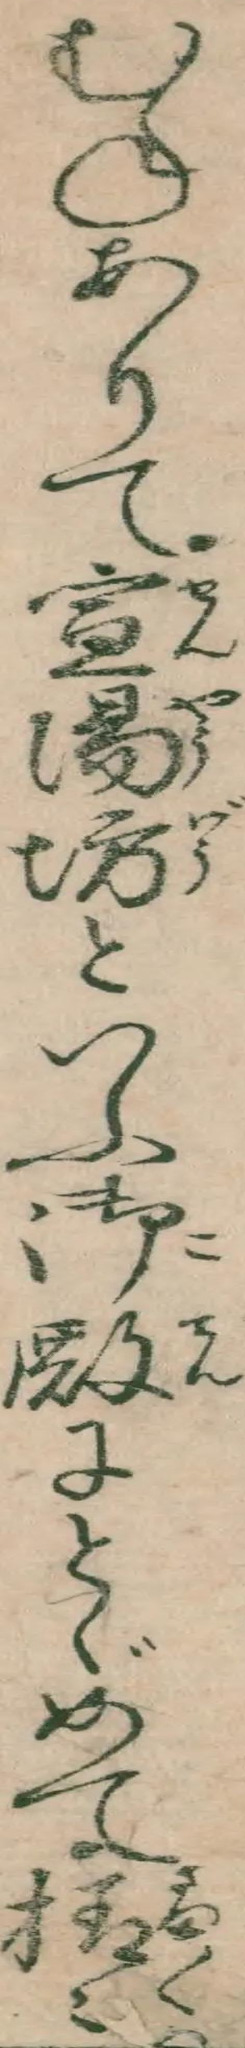むねありて。宣陽坊といふ御殿にとゞめて。様々
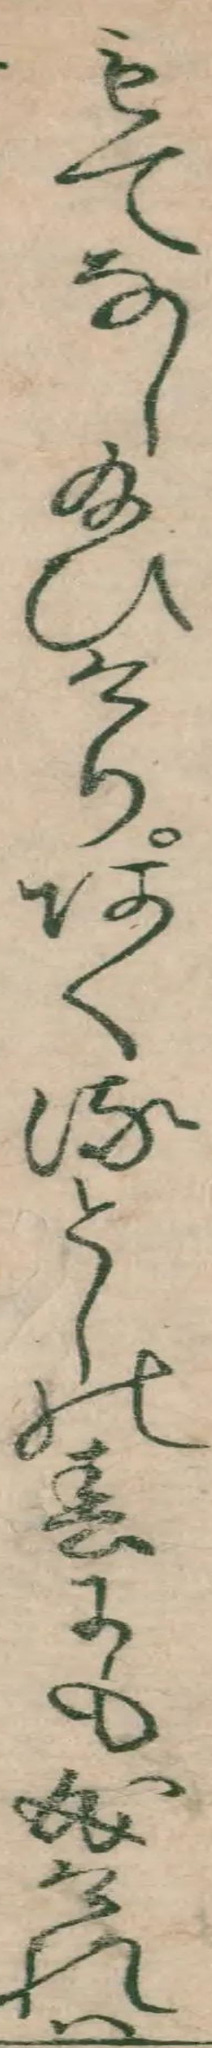もてなし給ひけり。あくるとしの春にも。成けれは
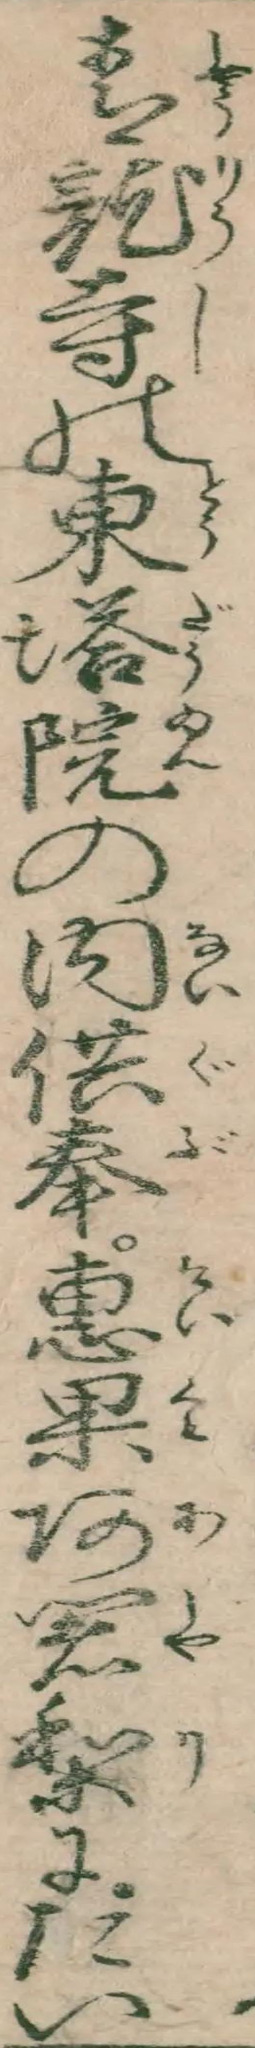青龍寺の東塔院の内供奉。恵果阿闍梨に。たい
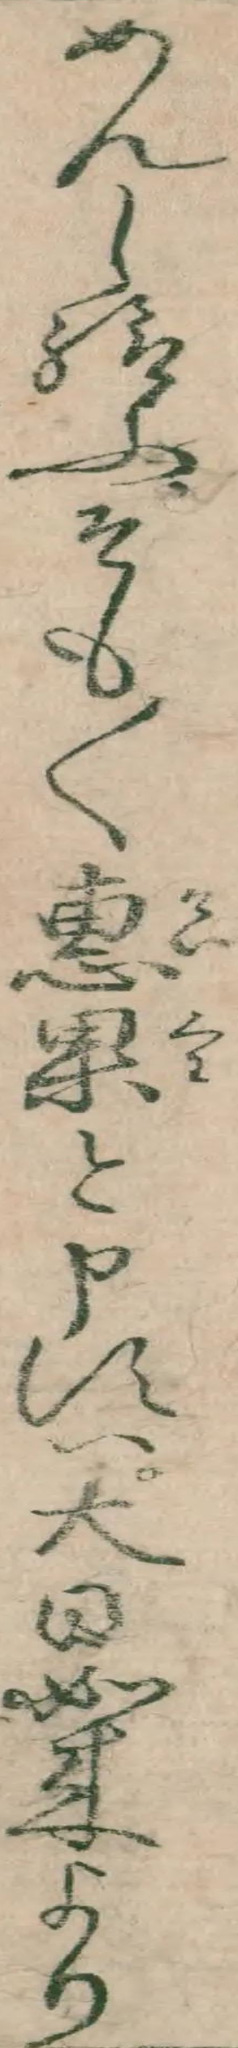めんし給ふ。そも〳〵恵果と申すは。大日如来より
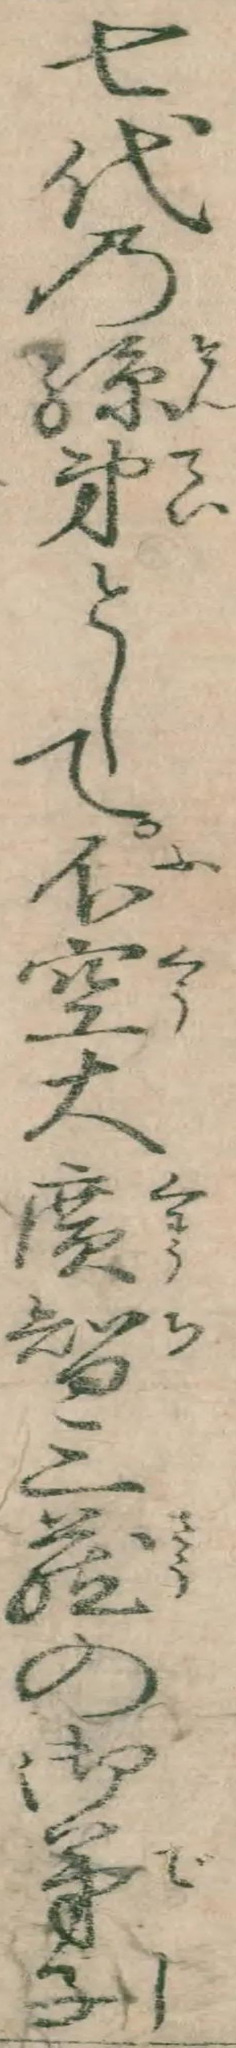七代の孫弟として。不空大広智三蔵の御弟子
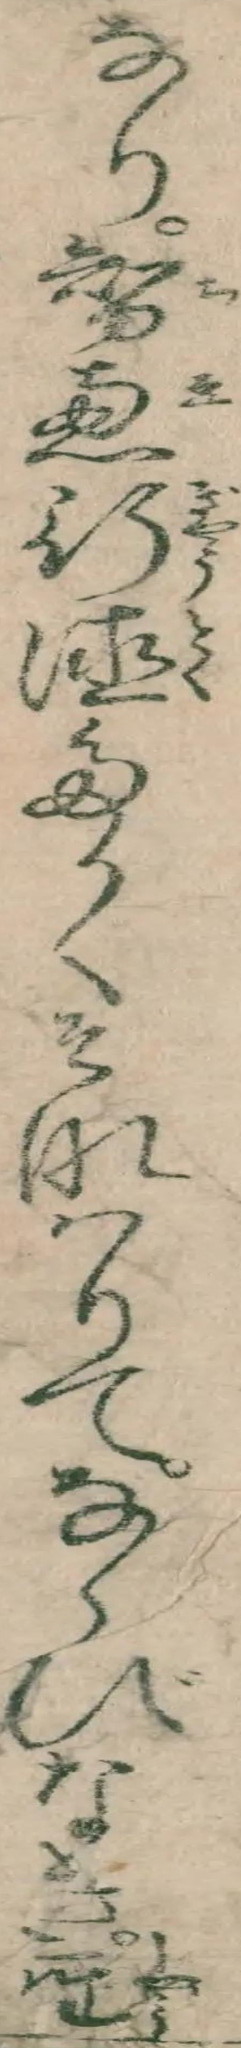なり。智慧行徳たかくそなはりて。ならびなき聖
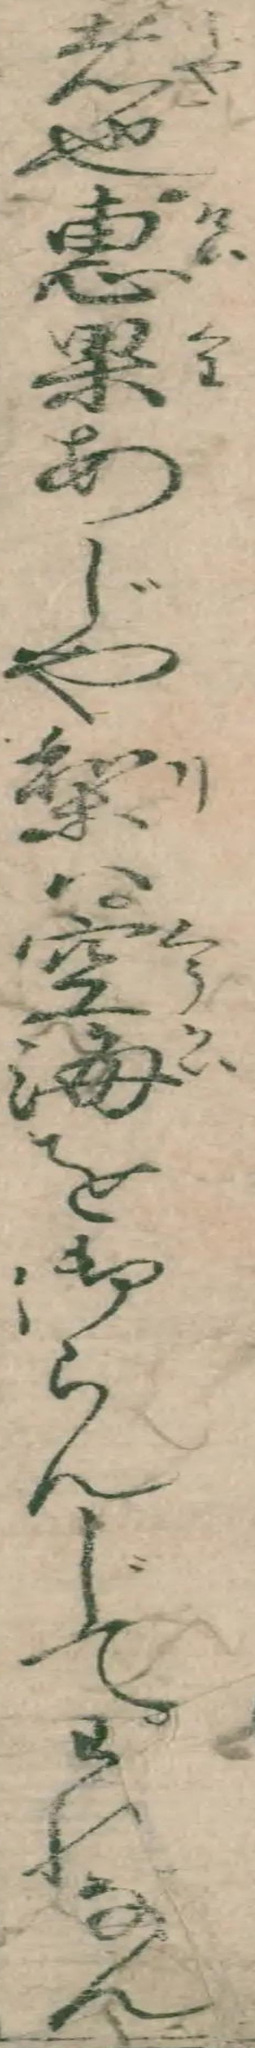者也。恵果あじや梨は。空海を御らんじて。われなん

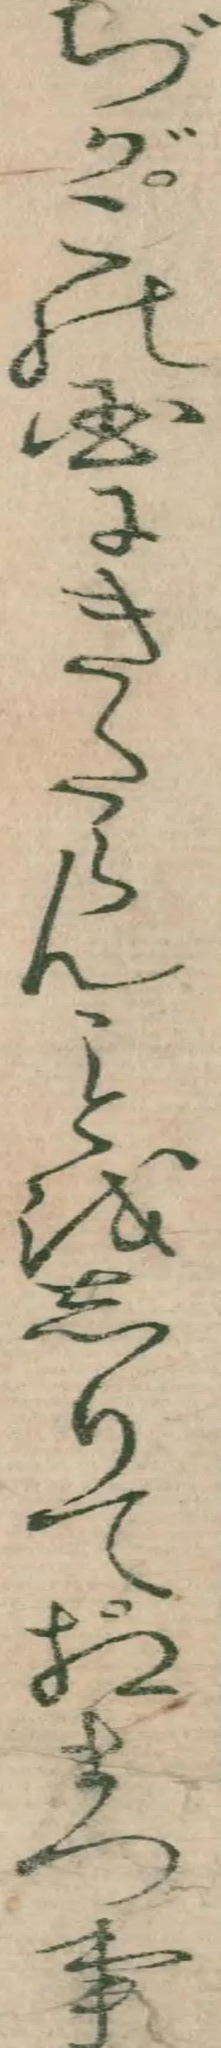ぢらが。この国にきたらんことをしりて。相まつ事
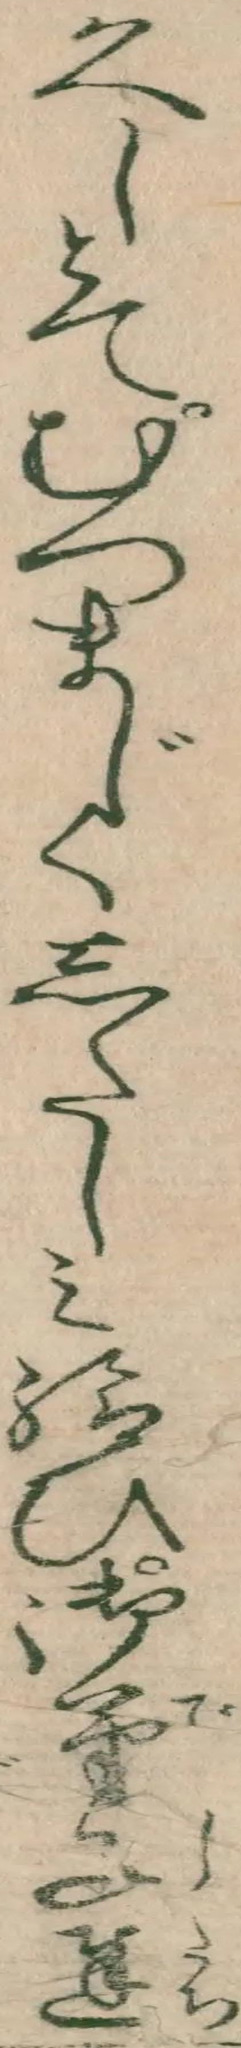久しとて。むつまじくしたしみ給ひ。御弟子達
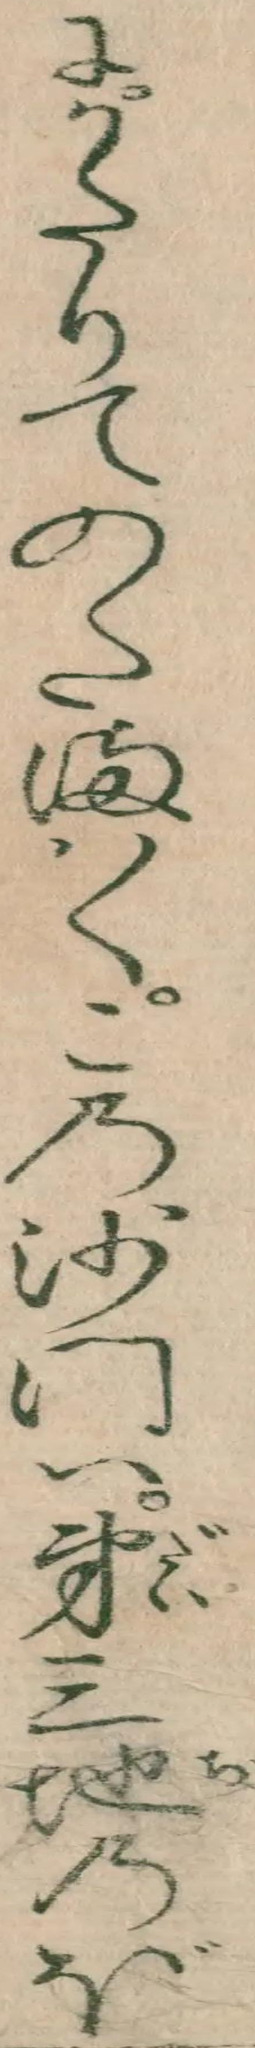に。かたりてのたまはく。この沙門は。第三地のぼ
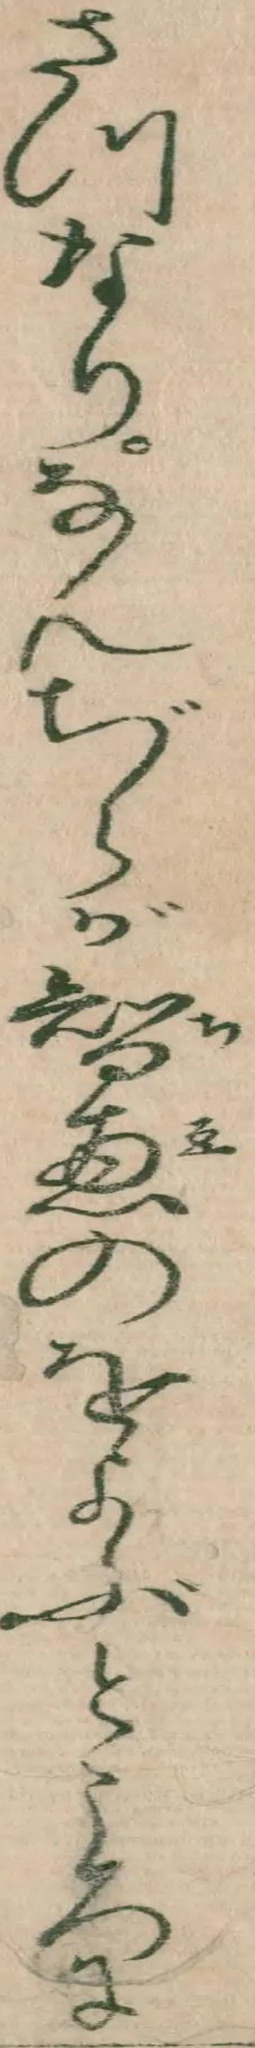さつなり。なんぢらが智慧のをよぶところに
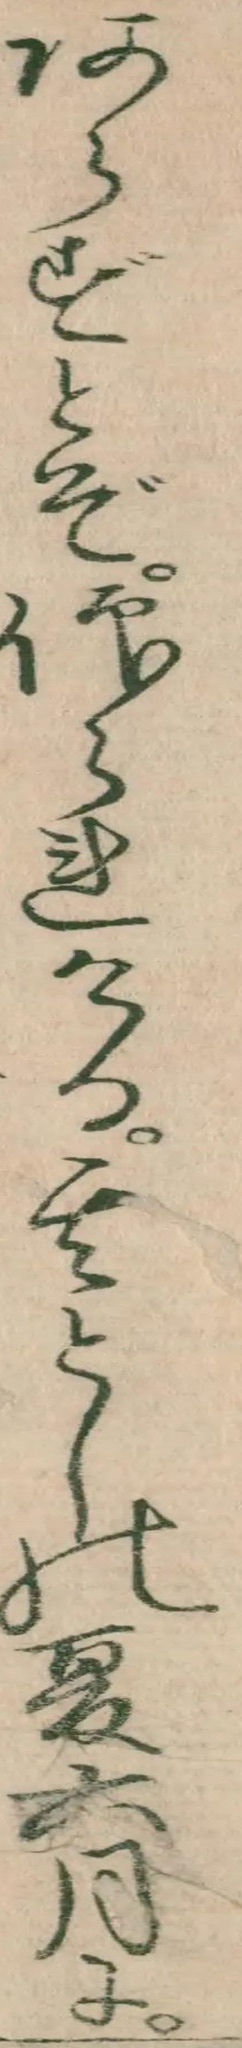あらずとぞ。仰られける。其としの夏六月に。
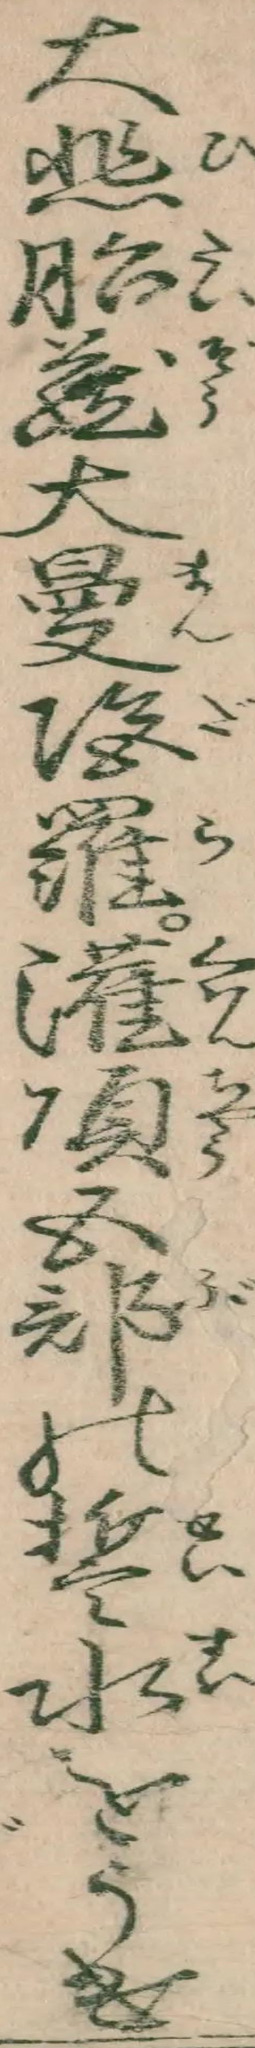大悲胎蔵大曼荼羅。灌頂五部の誓水をうけ
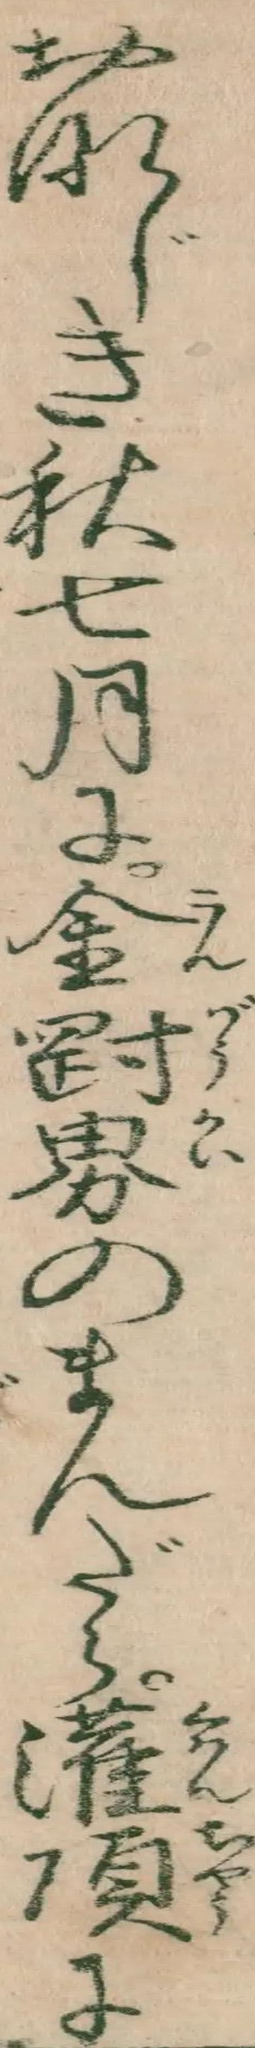おなじき秋七月に。金剛界のまんだら。灌頂に
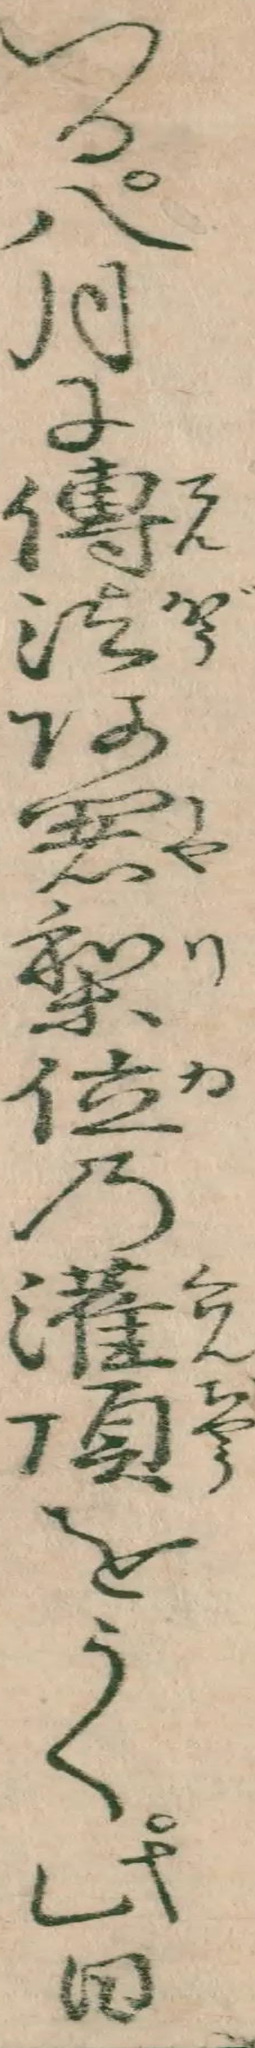いる。八月に伝法阿闍梨位の灌頂をうく。此日
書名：弘法大師御本地 3巻. [1]
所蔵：国立国会図書館 National Diet Library, JAPAN
